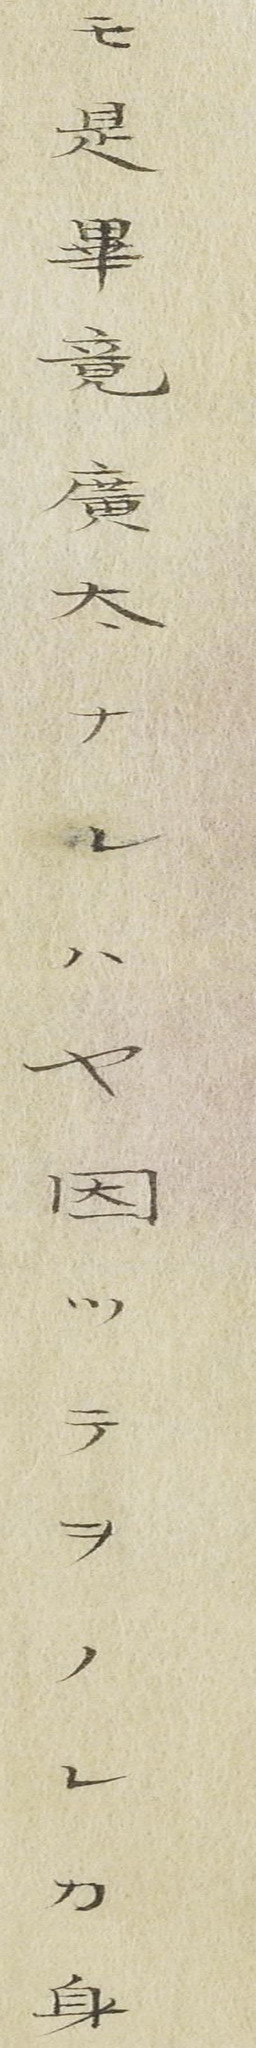モ是畢竟広太ナルハヤ因ツテヲノレカ身
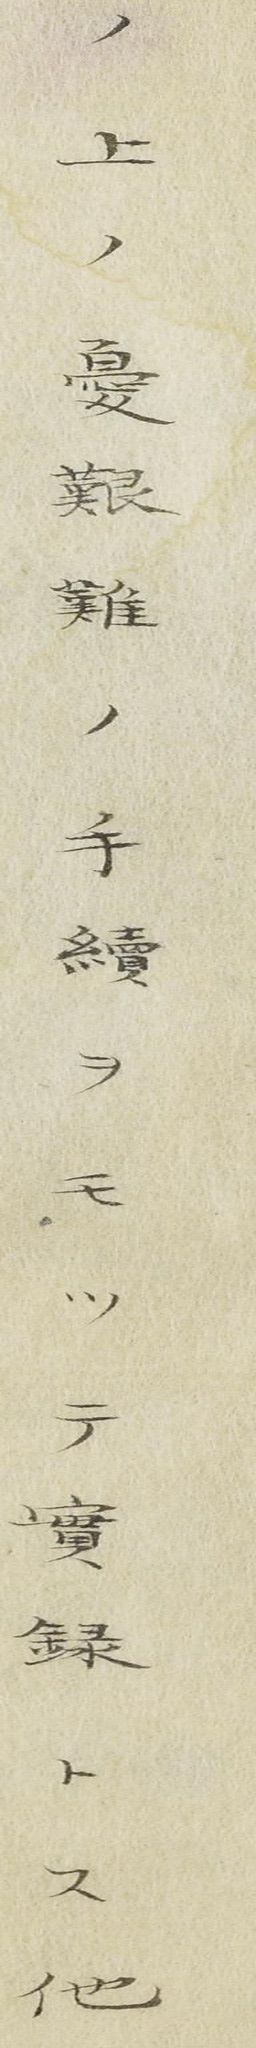ノ上ノ憂艱難ノ手続ヲモツテ実録トス他
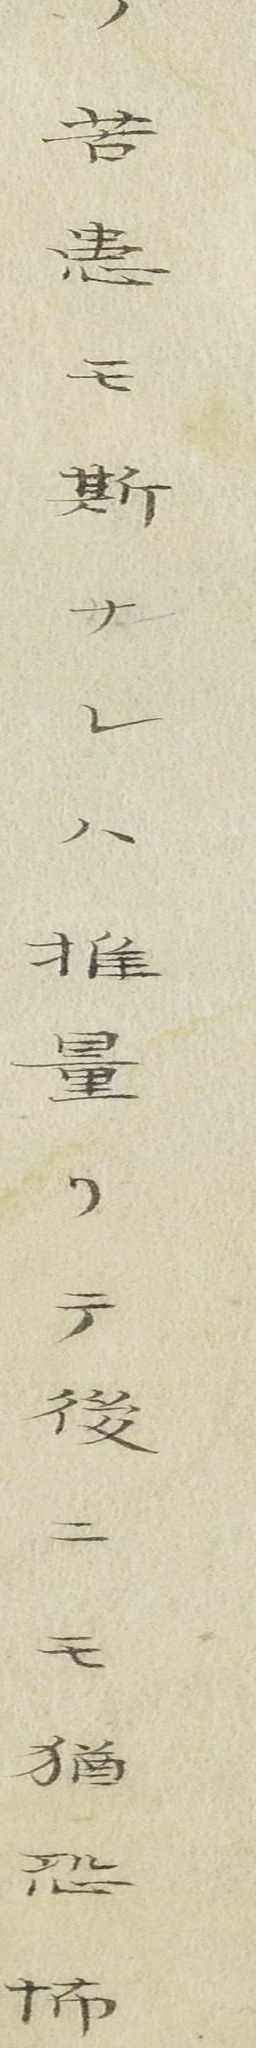ノ苦患モ斯ナレハ推量リテ後ニモ猶恐怖
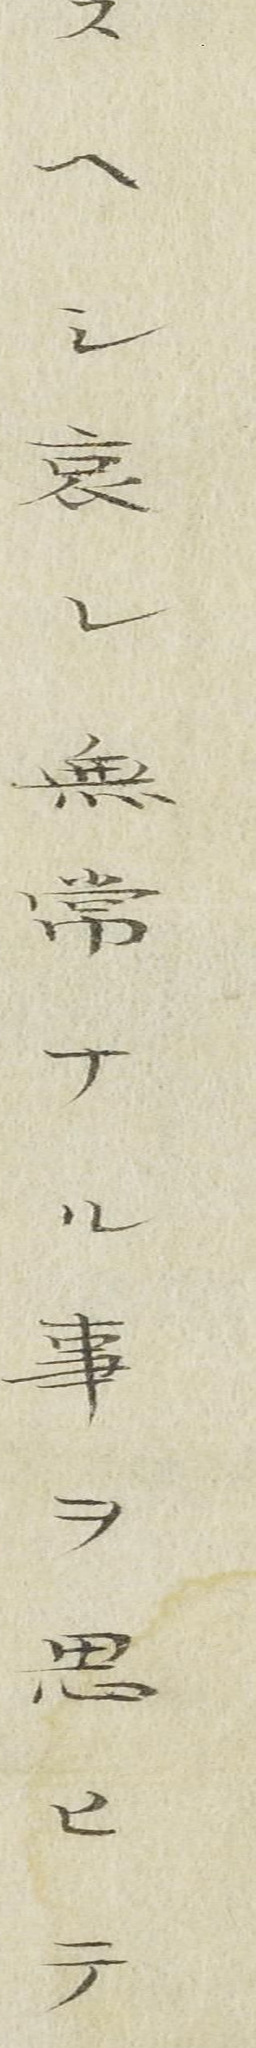スヘシ哀レ無常ナル事ヲ思ヒテ

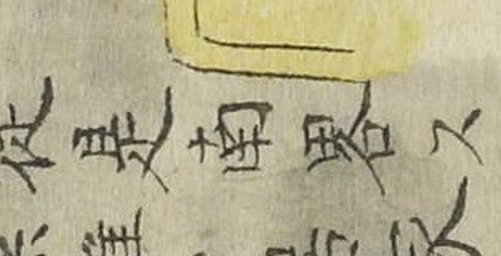従是南略ス
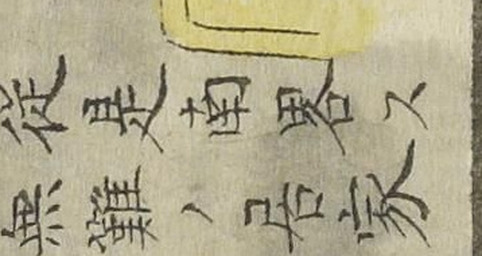従是南略ス
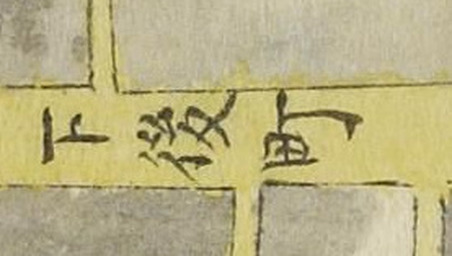下後町
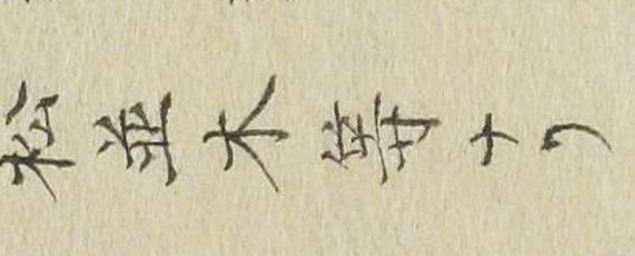〇松並木等ナリ
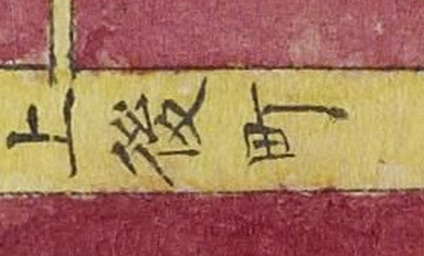上後町
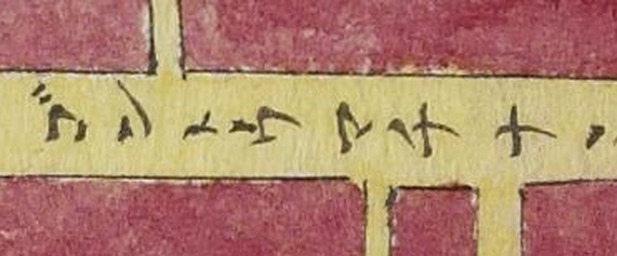ゴントウマチナミ

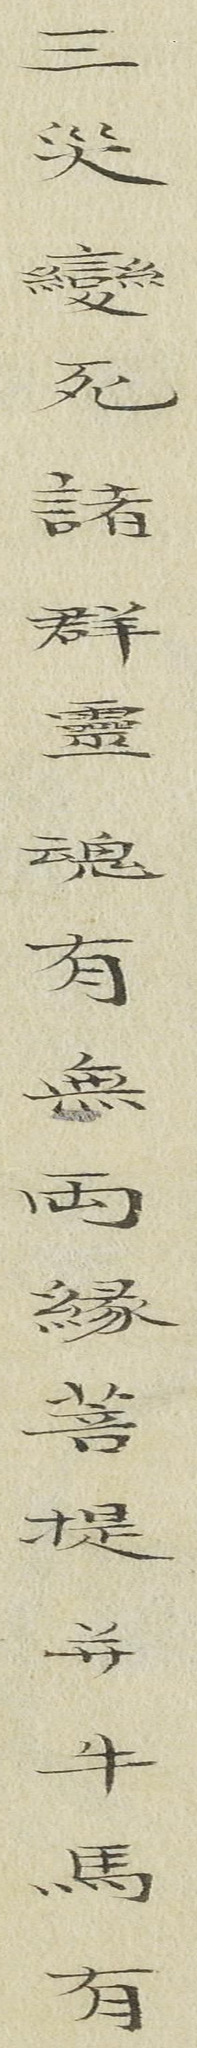三災変死諸群霊魂有無両縁菩提幷牛馬有
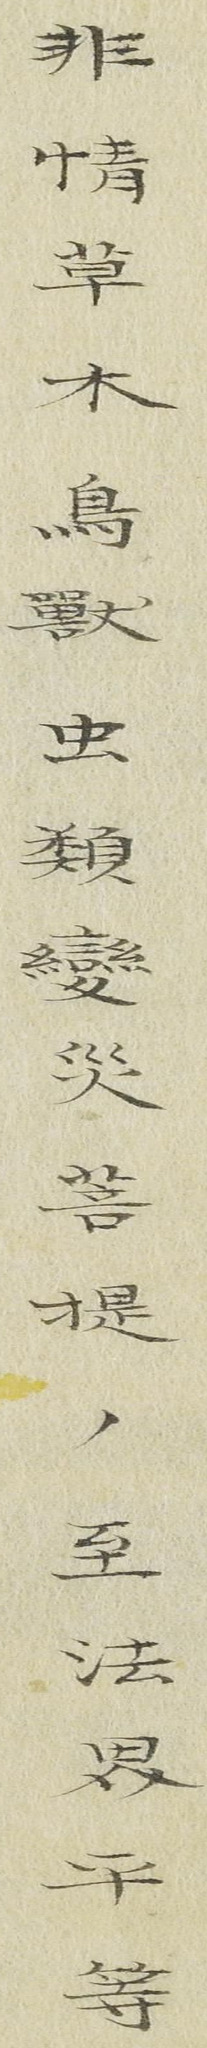非常草木鳥獣虫類変災菩提ノ至法界平等
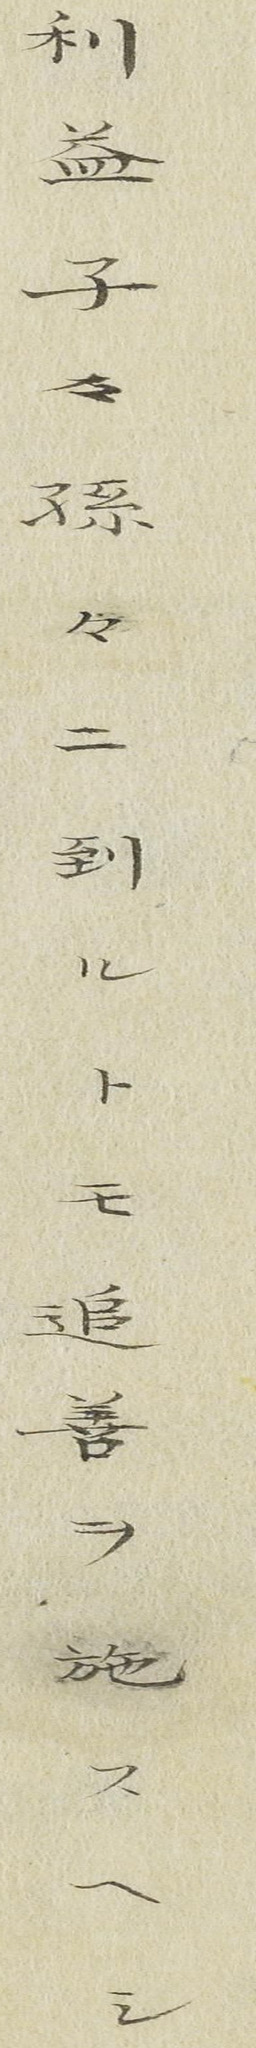利益子々孫々ニ到ルトモ追善ヲ施スヘシ
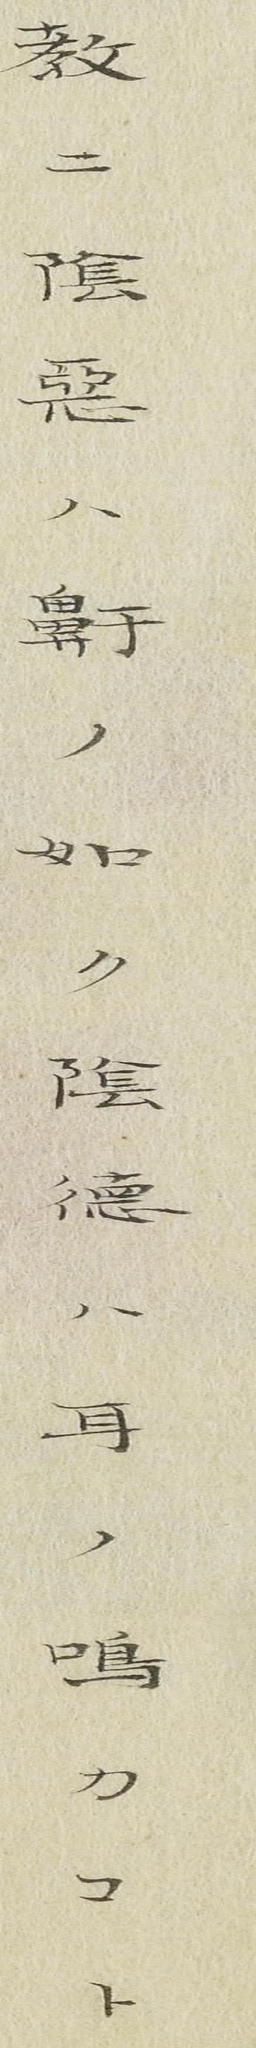教ニ陰悪ハ鼾ノ如ク陰徳ハ耳ノ鳴カコト
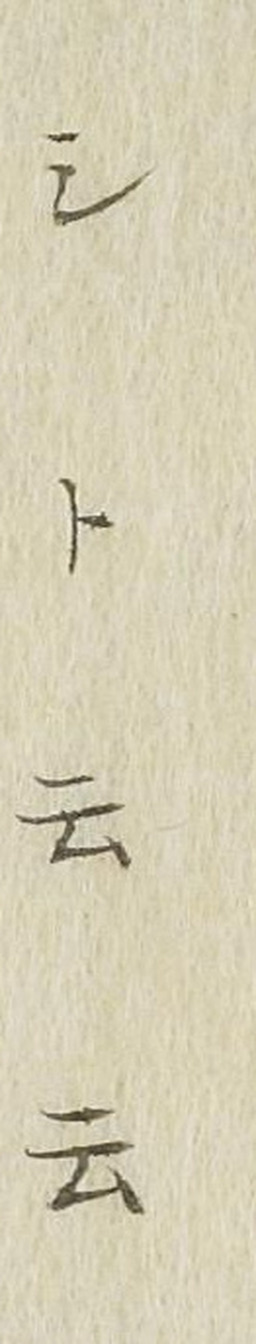シト云云
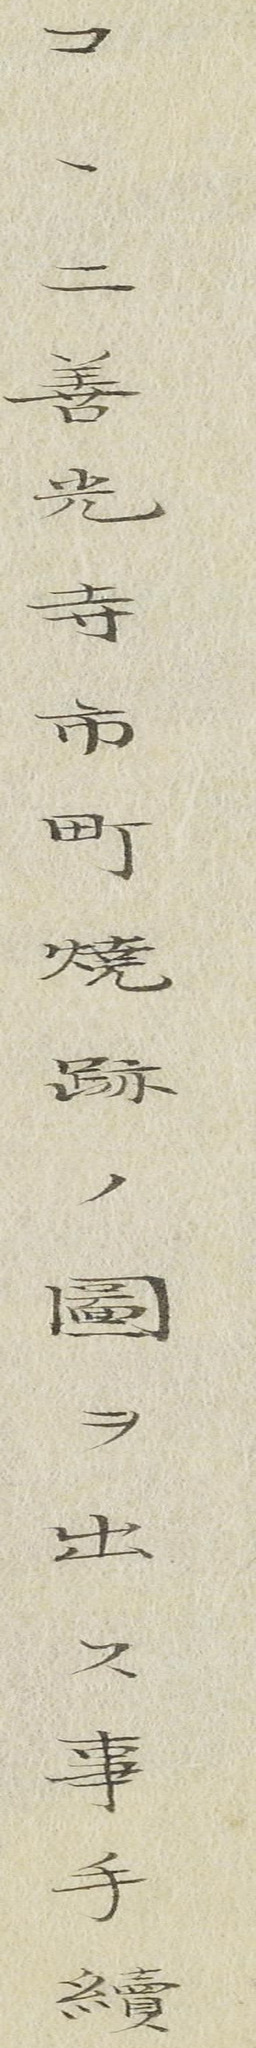コヽニ善光寺市町焼跡ノ図ヲ出ス事手続
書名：地災撮要　地震之部　巻ノ二
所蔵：東京大学地震研究所図書室 Earthquake Research Institute Library, The University of Tokyo, JAPAN
